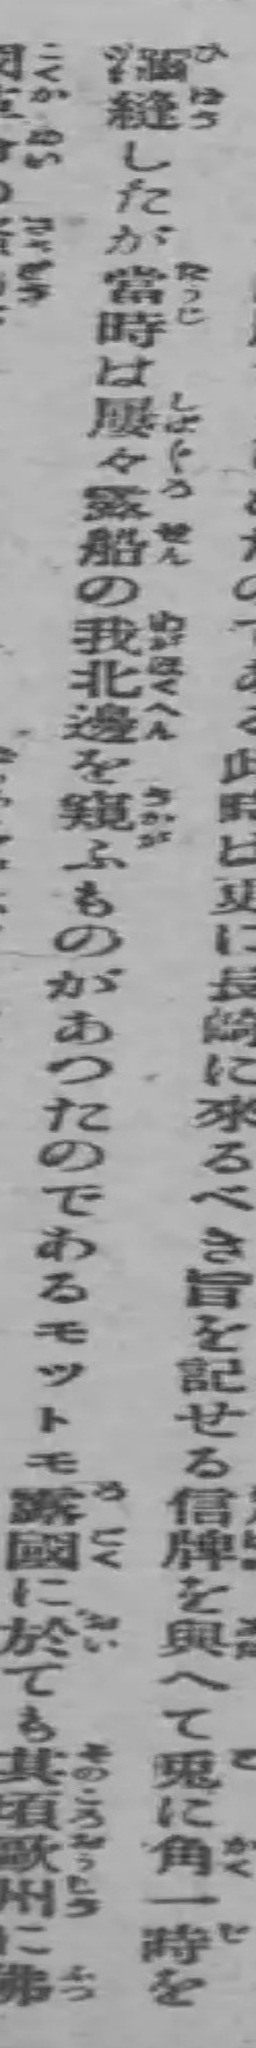瀰縫したが当時は屡々露船の我北辺を窺ふものがあつたのであるモツトモ露国に於ても其頃欧州に仏
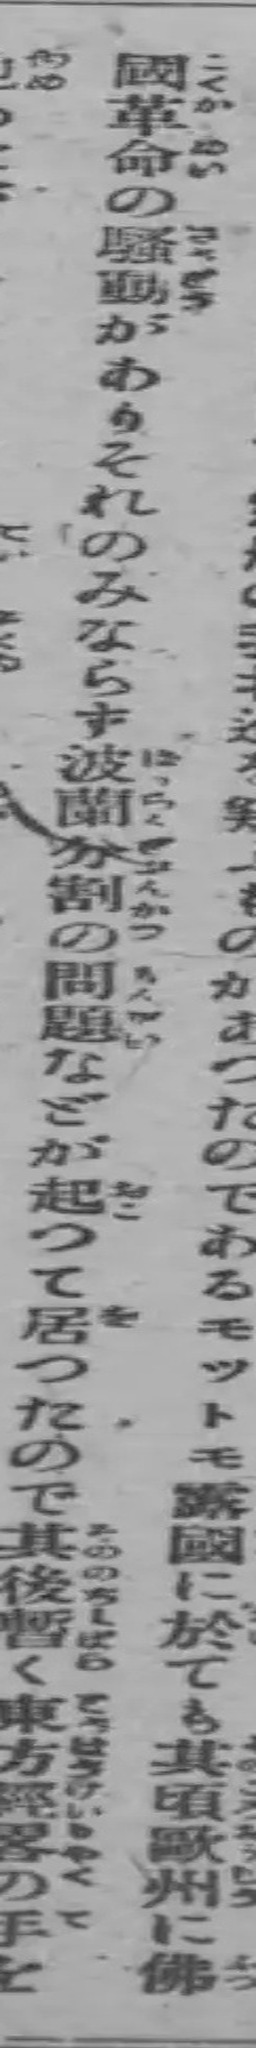国革命の騒動がありそれのみならず波蘭分割の問題などが起つて居つたので其後暫く東方経略の手を
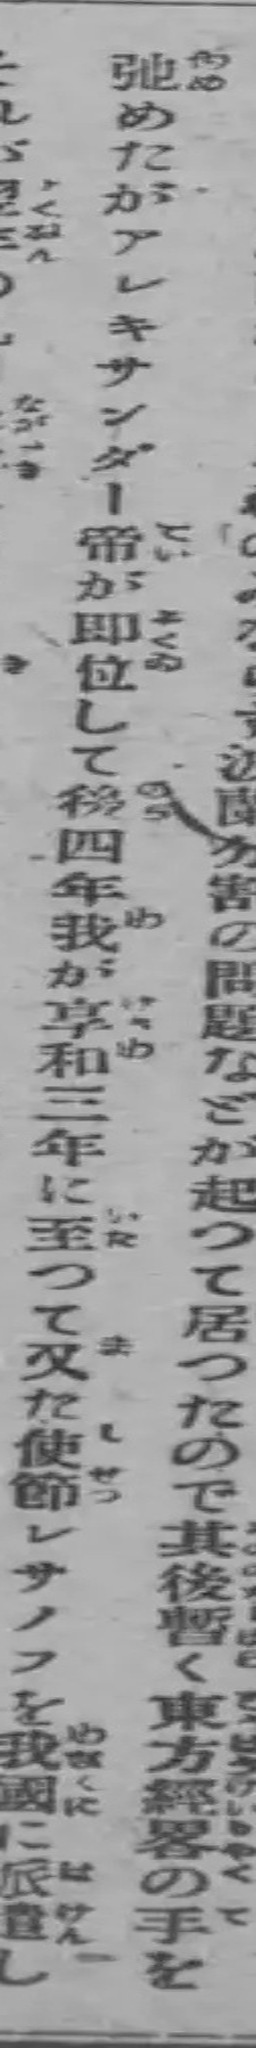弛めたがアレキサンダー帝が即位して後四年我が享和三年に至つて又た使節レサノフを我国に派遣し
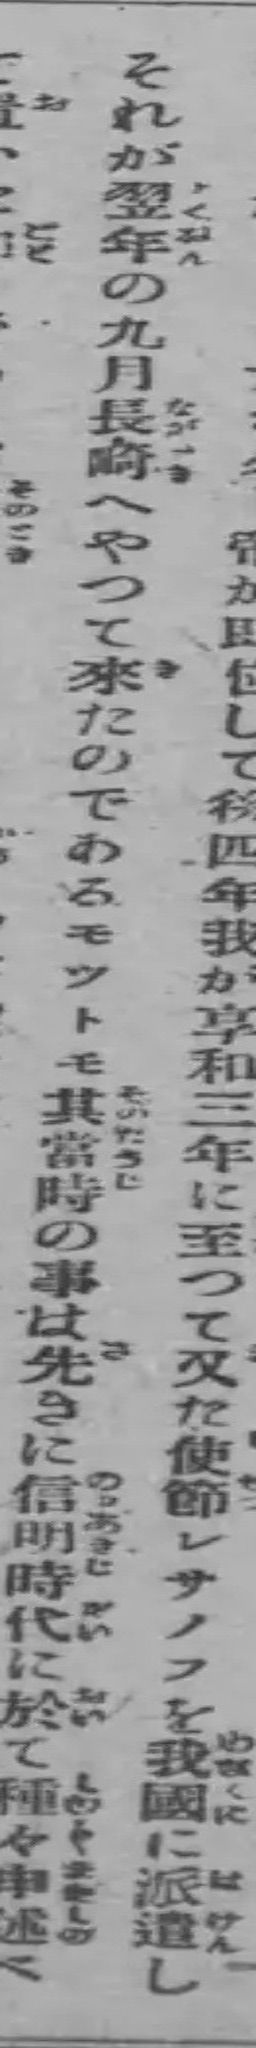それが翌年の九月長崎へやつて来たのであるモツトモ其当時の事は先きに信明時代に於て種々申述べ
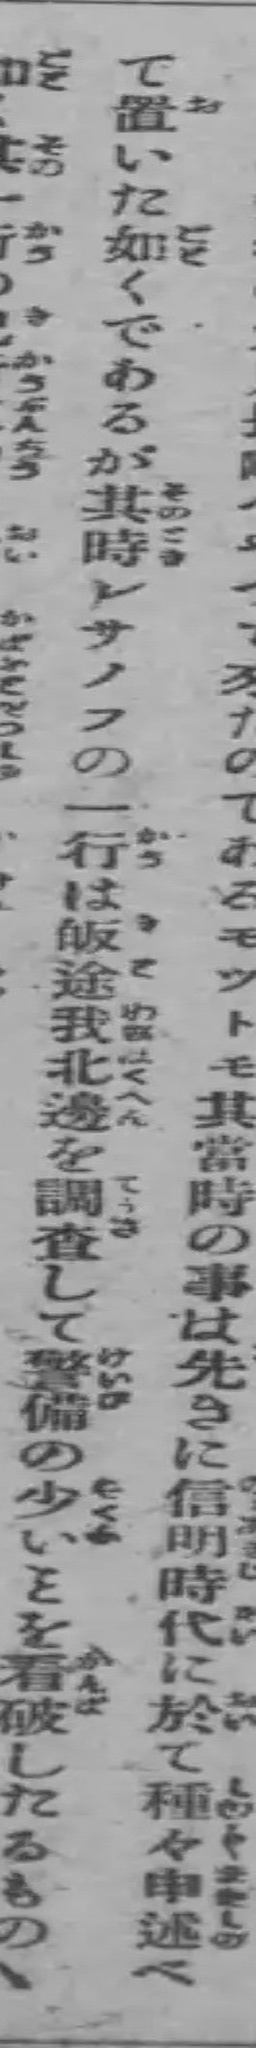て置いた如くであるが其時レサノフの一行は皈途我北辺を調査して警備の少いことを看破したるものゝ
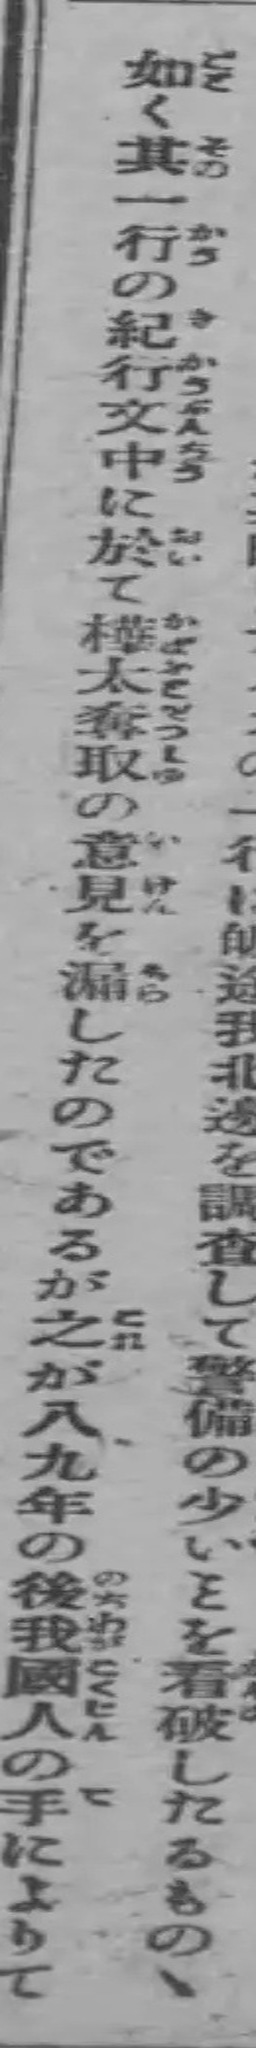如く其一行の紀行文中に於て樺太奪取の意見を漏したのであるが之が八九年の後我国人の手によりて
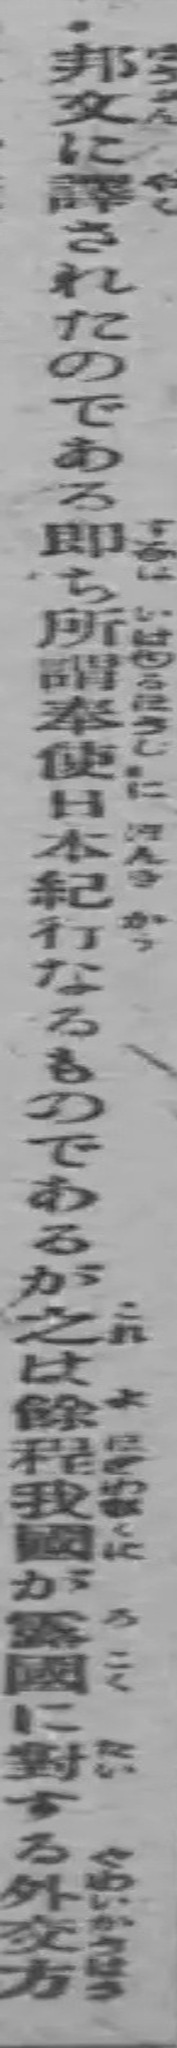邦文に訳されたのである即ち所謂奉使日本紀行なるものであるが之は余程我国が露国に対する外交方
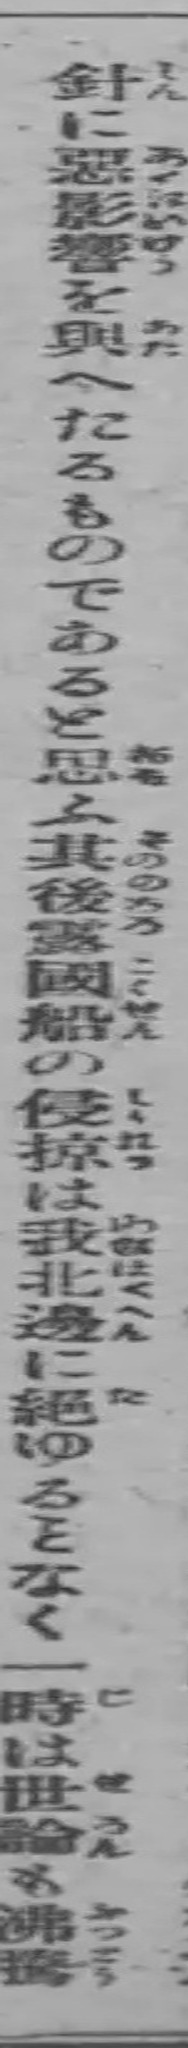針に悪影響を与へたるものであると思ふ其後露国船の侵掠は我北辺に絶ゆることなく一時は世論も沸騰
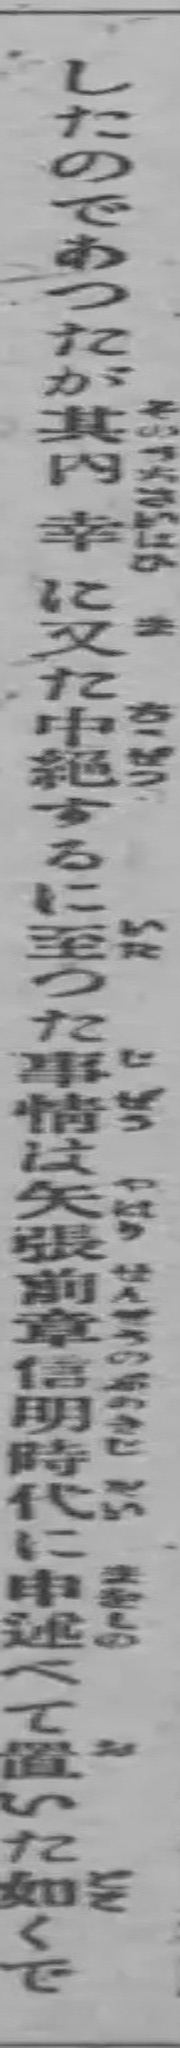したのであつたが其内幸に又た中絶するに至つた事情は矢張前章信明時代に申述べて置いた如くで
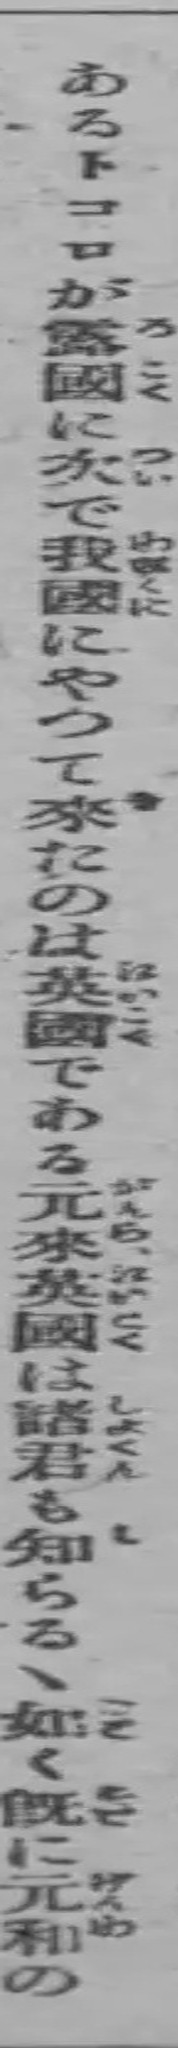あるトコロが露国に次で我国にやつて来たのは英国である元来英国は諸君も知らるゝ如く既に元和の
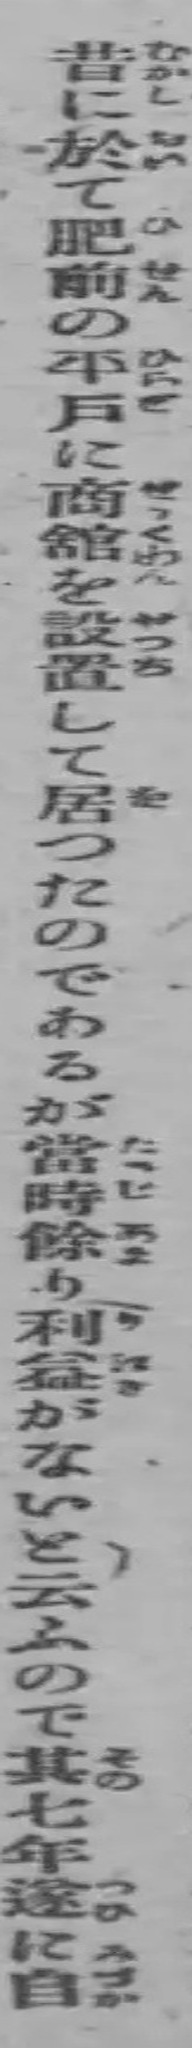昔に於て肥前の平戸に商館を設置して居つたのであるが当時余り利益がないと云ふので其七年遂に自
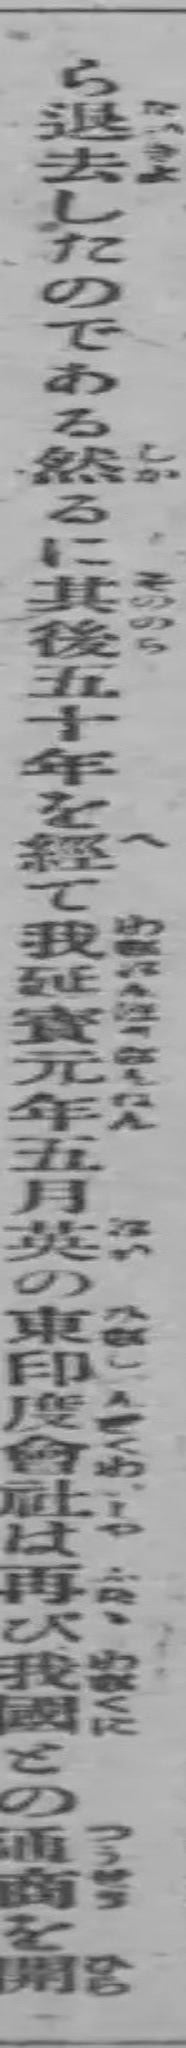ら退去したのである然るに其後五十年を経て我延宝元年五月英の東印度会社は再び我国との通商を開
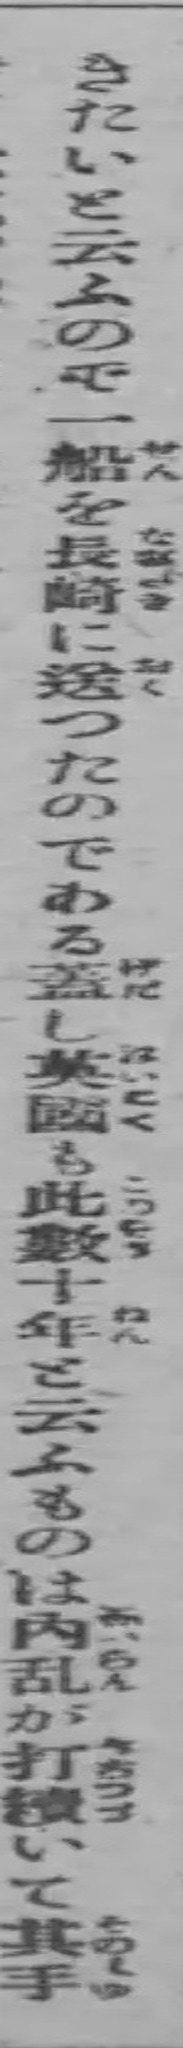きたいと云ふので一船を長崎に送つたのである蓋し英国も此数十年と云ふものは内乱が打続いて其手
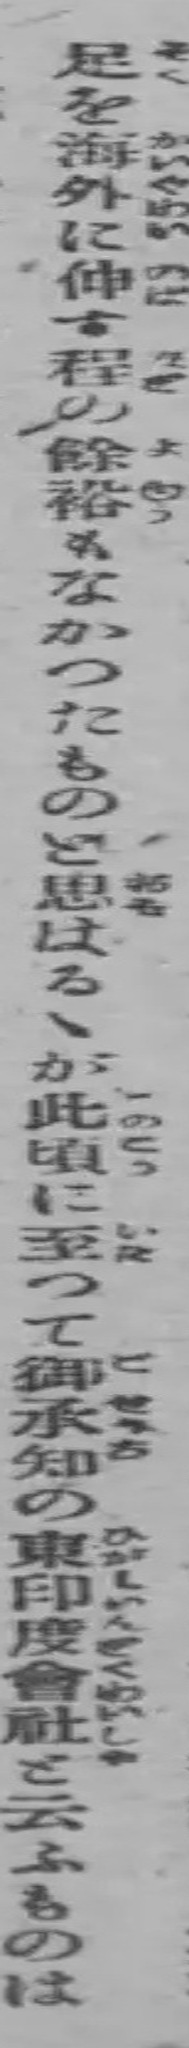足を海外に伸す程の余裕もなかつたものと思はるゝが此頃に至つて御承知の東印度会社と云ふものは
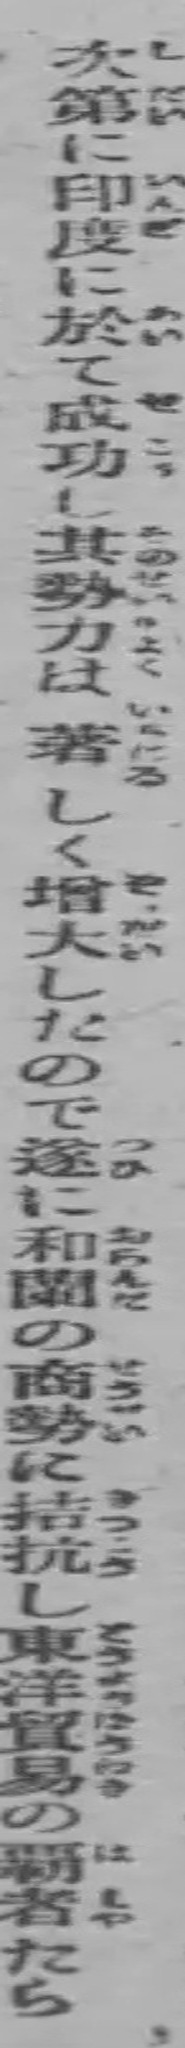次第に印度に於て成功し其勢力は著しく増大したので遂に和蘭の商勢に拮抗し東洋貿易の覇者たら
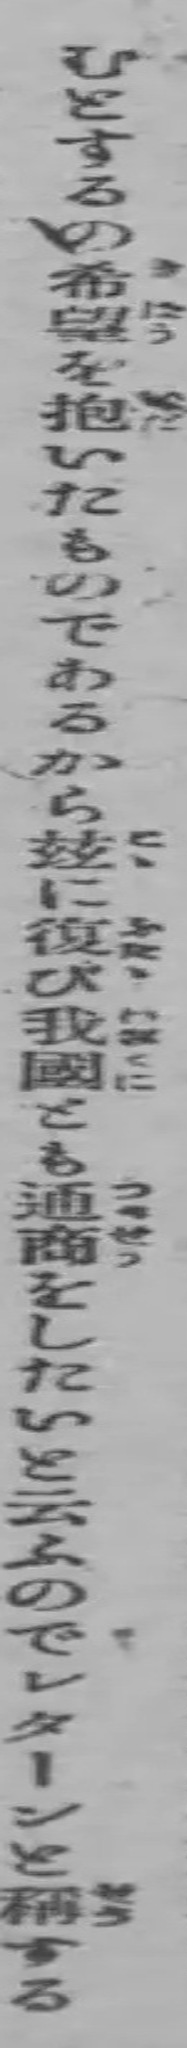むとするの希望を抱いたものであるから茲に復び我国とも通商をしたいと云ふのでレターンと称する
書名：豊橋市史談
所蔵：国立国会図書館 National Diet Library, JAPAN
